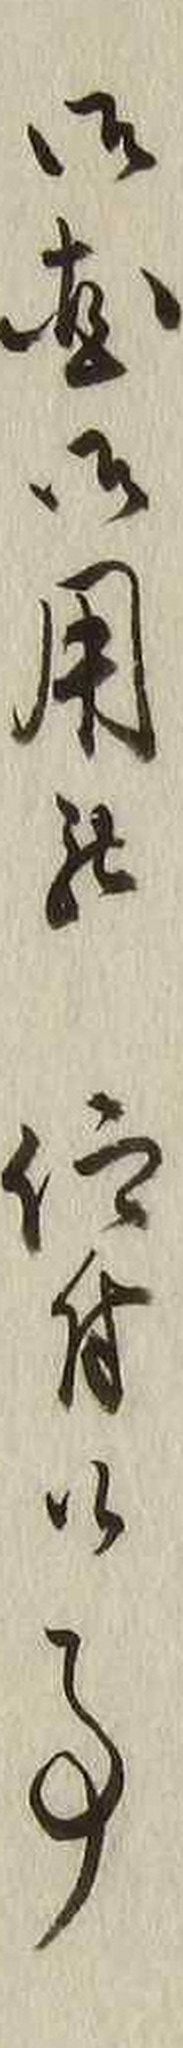御固御用被仰付候事
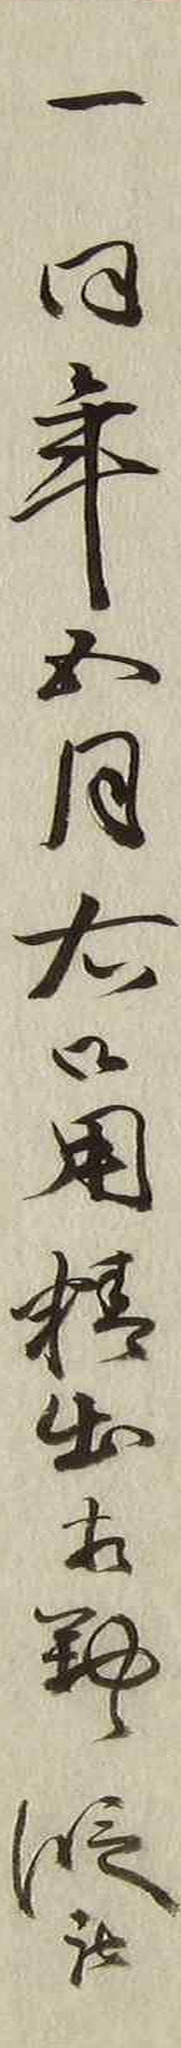一同年五月右御用精出相勤候段被
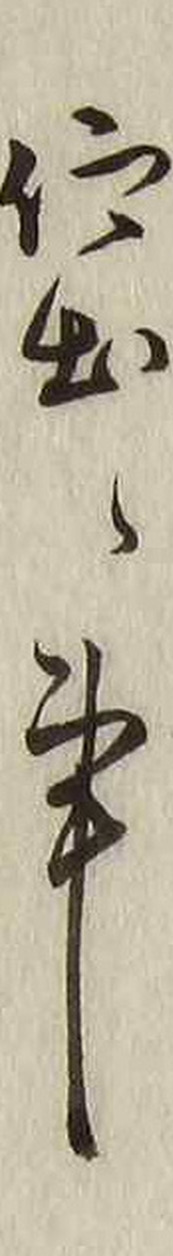仰出候事
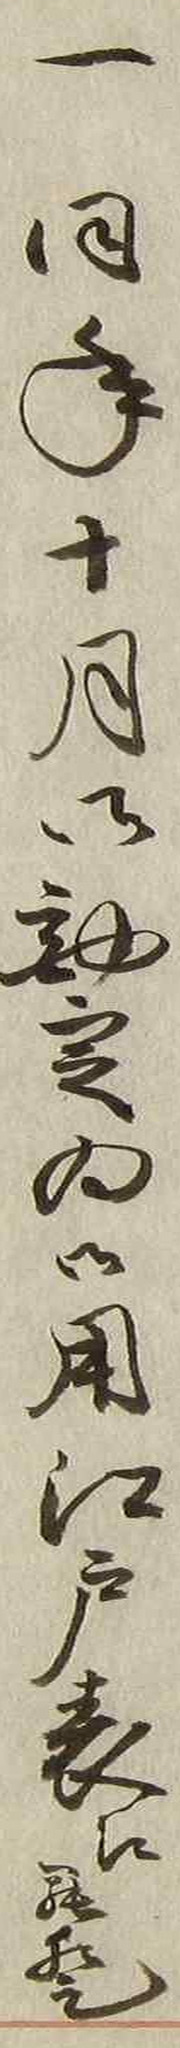一同年十月御勘定為御用江戸表江罷登
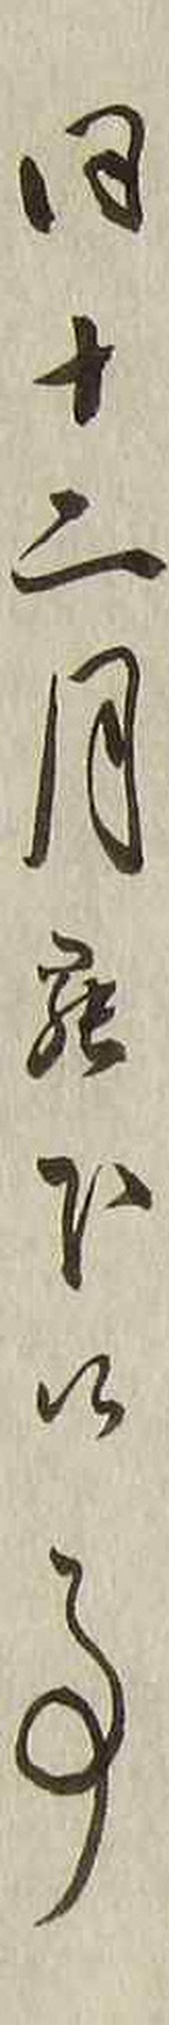同十二月罷下候事
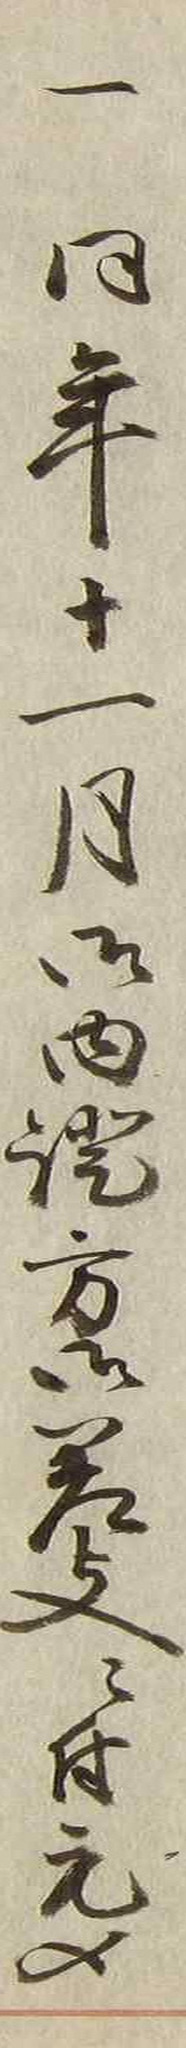一同年十一月御内証方御差文ニ付元〆

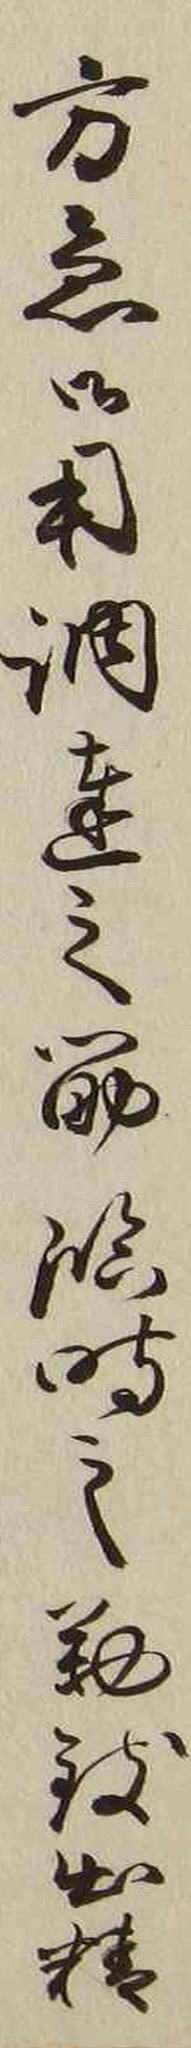方急御用調達之筋臨時之勤致出精
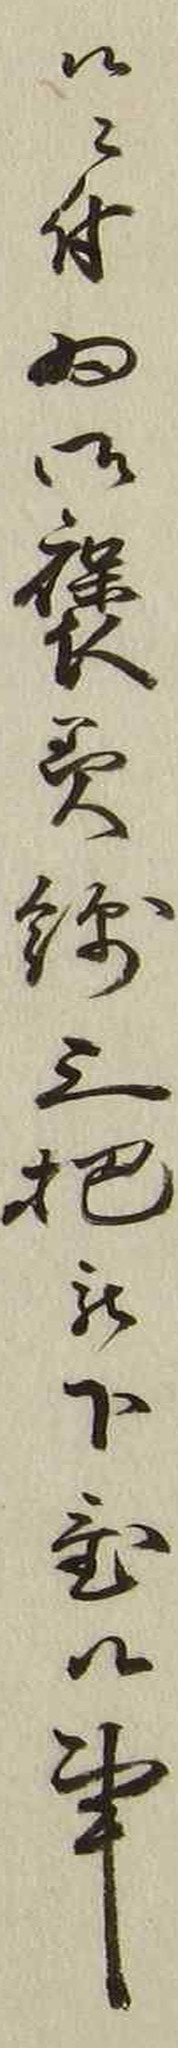候ニ付為御褒美綿三把被下置候事
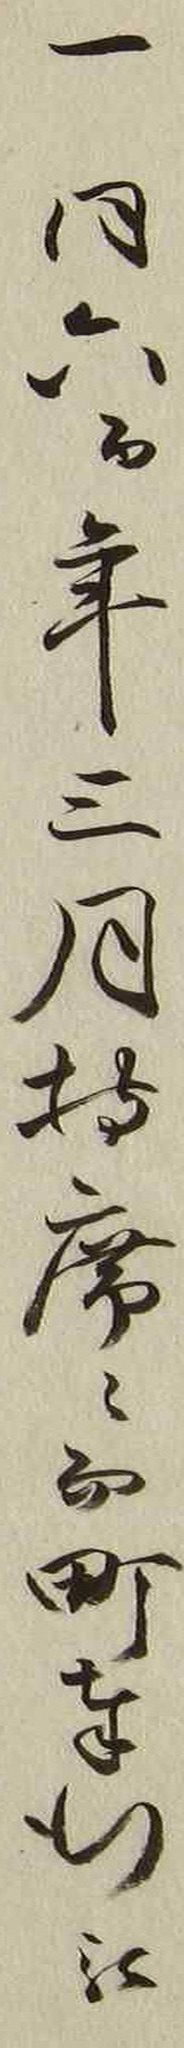一同六酉年三月持席ニ而町奉行被
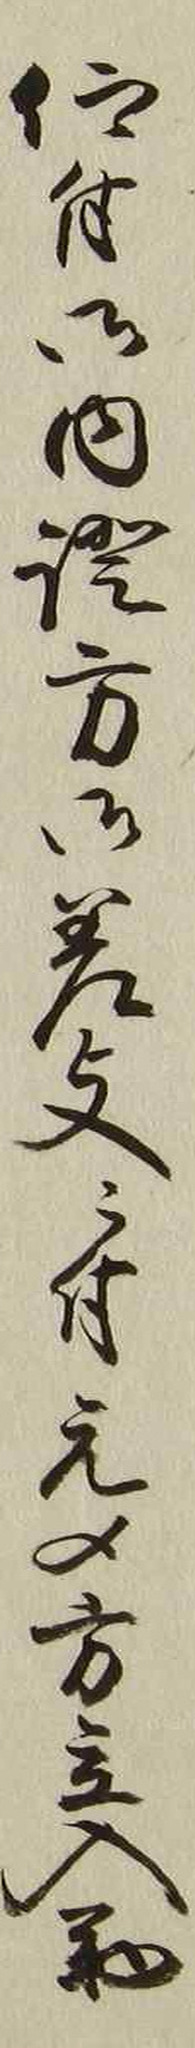仰付御内証方御差支ニ付元〆方立入勤
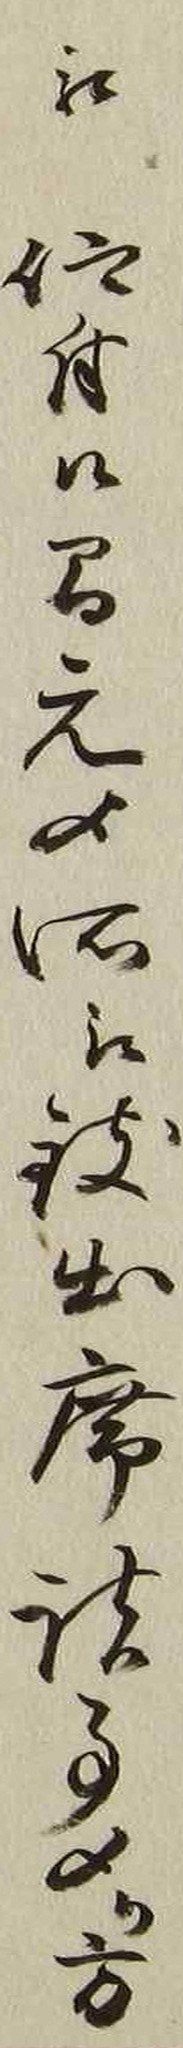被仰付候間元〆所江致出席諸事〆り方
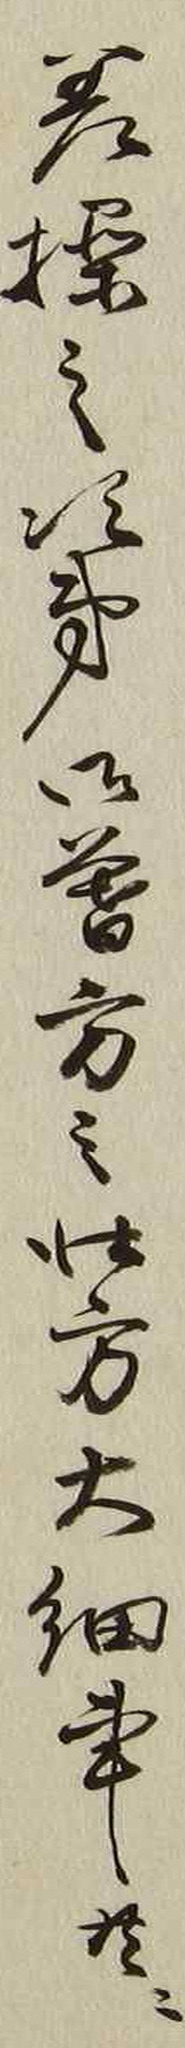差操之次第御暮方之仕方大細事共ニ
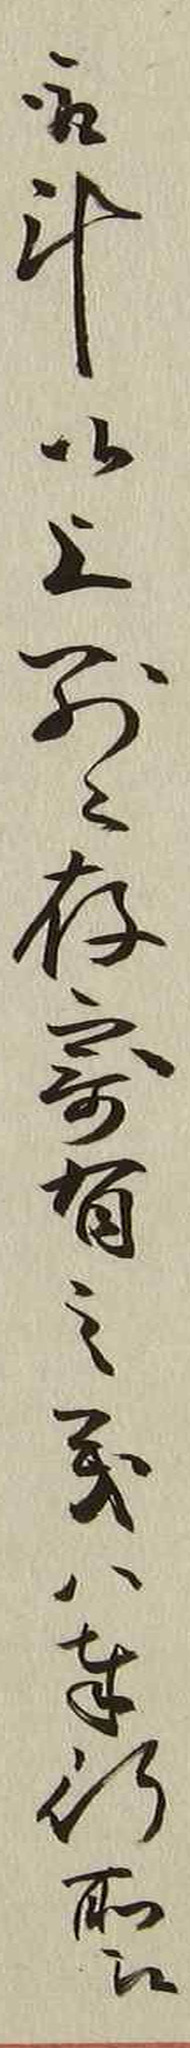取計候上別ニ存寄有之義ハ奉行所江
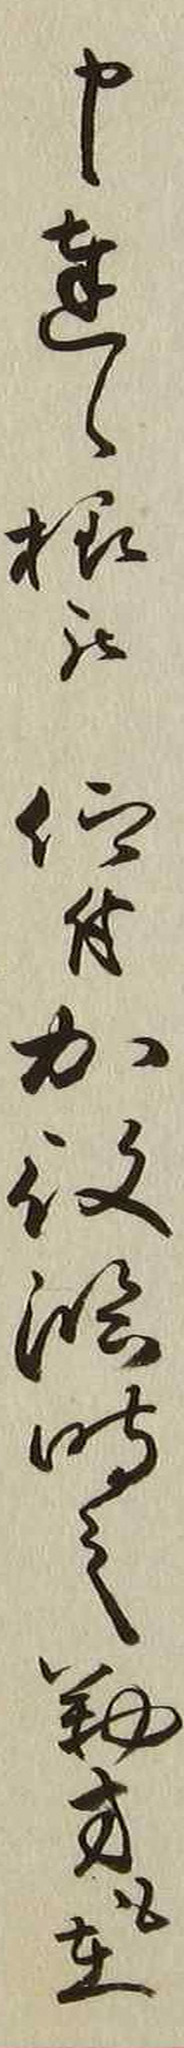申達候様被仰付加役臨時之勤方も在
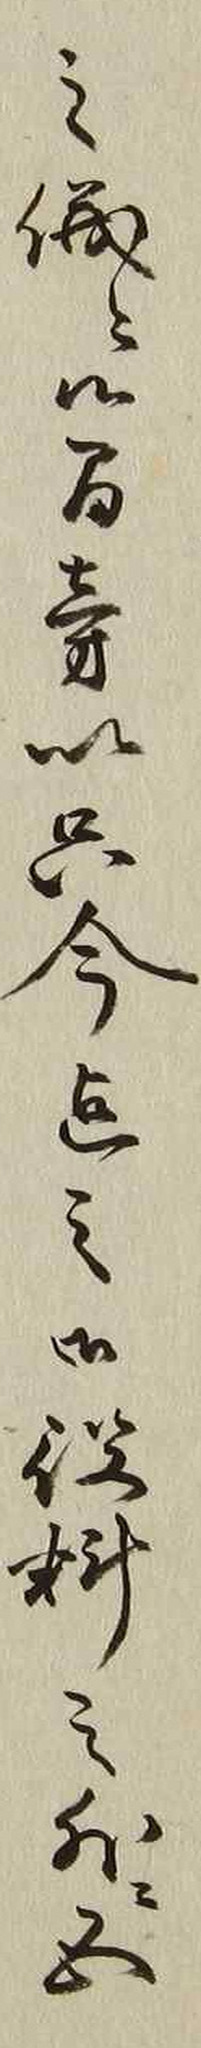之儀ニ侯間旁以只今迄之御役料之外ニ五
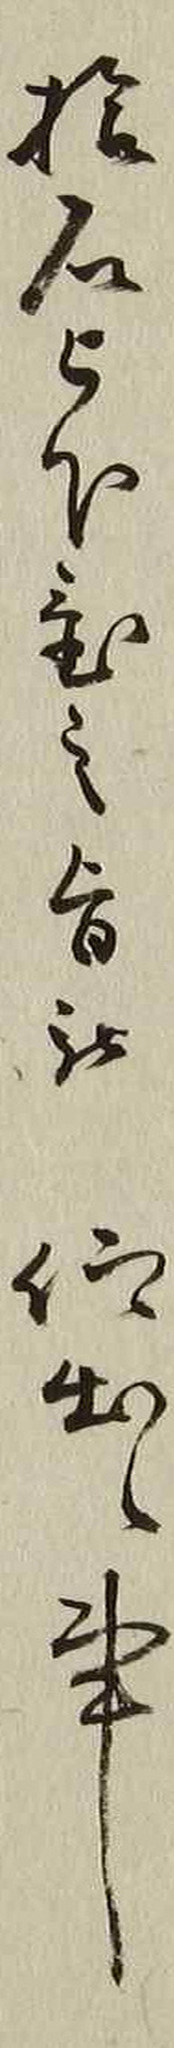拾石被下置旨被仰出候事
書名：諸士系譜　巻之15　い之部15
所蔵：会津若松市立会津図書館
